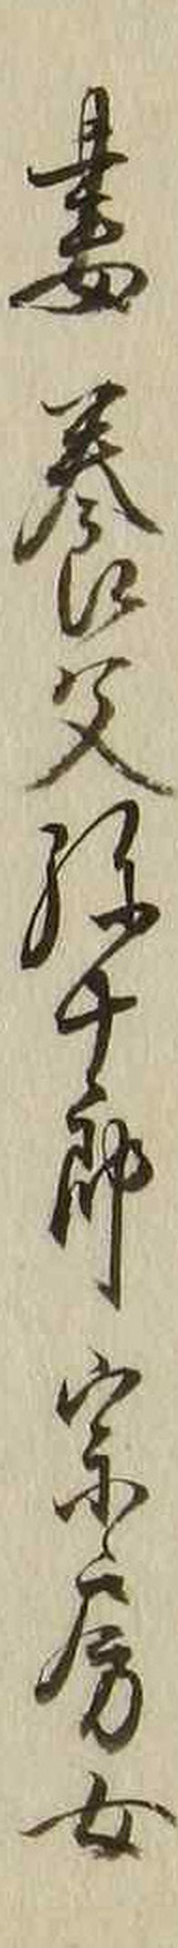妻養父弥十郎宗房女
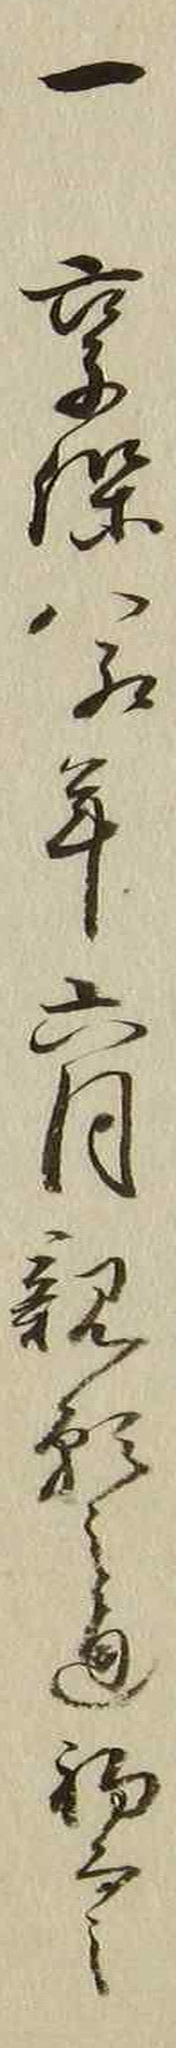一享保八卯年六月親願之通初而之
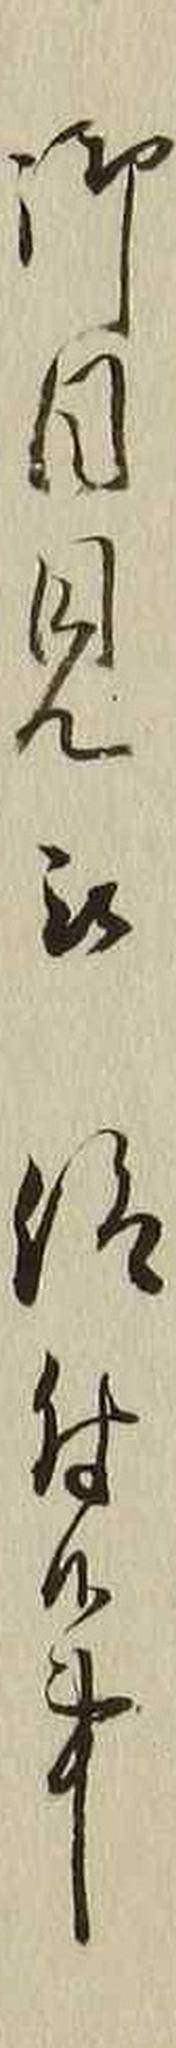御日見被仰付候事
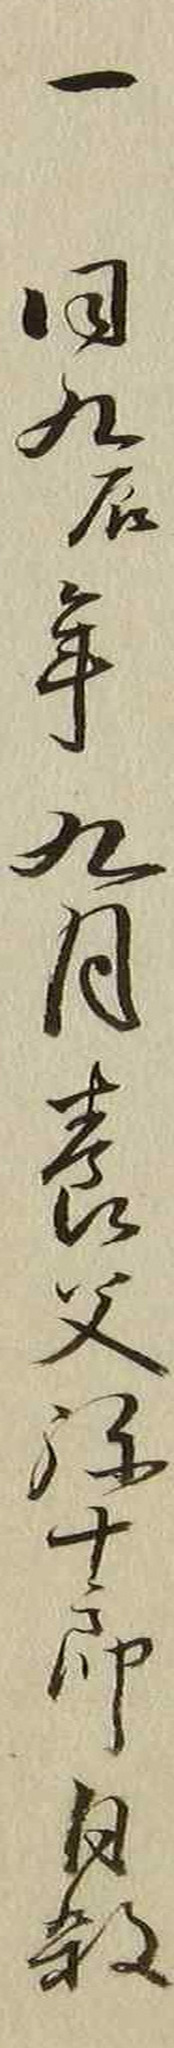一同九辰年九月養父弥十郎自殺
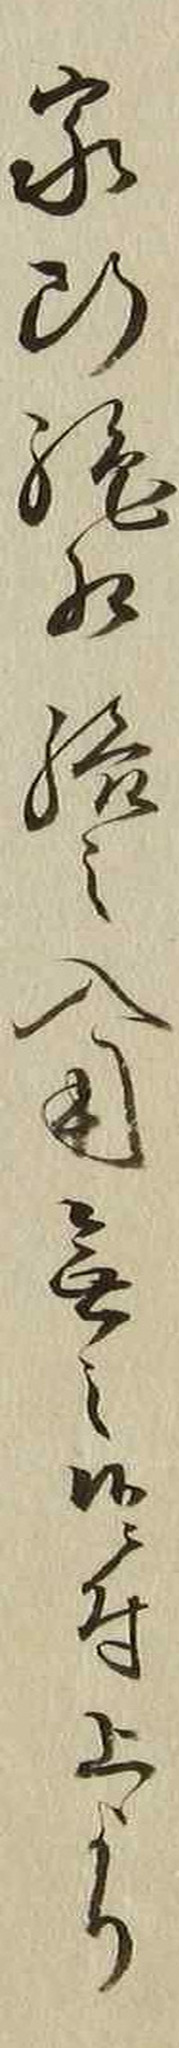家断絶相給之入用無之候ニ付上より
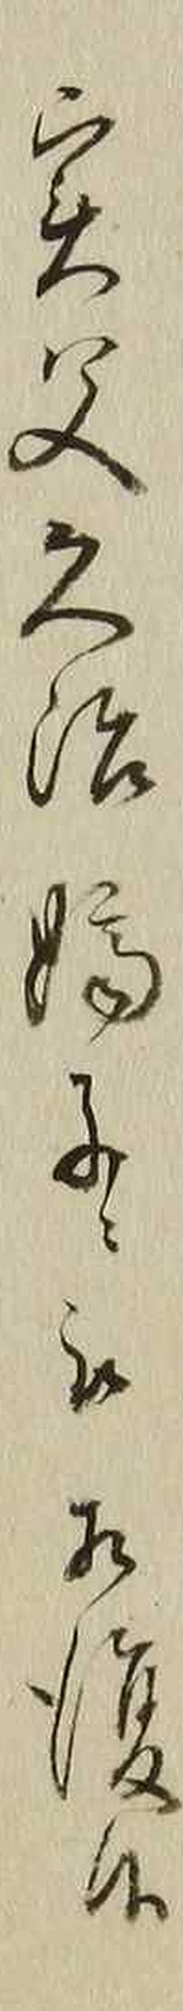実父久治嫡子ニ被相復候
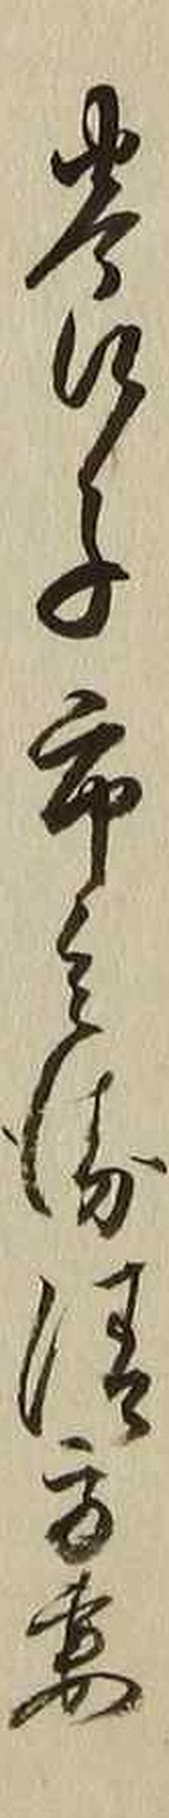女養子市兵衛清方妻
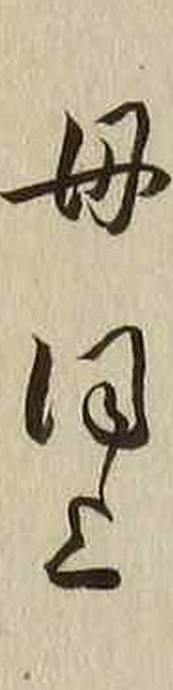母同上
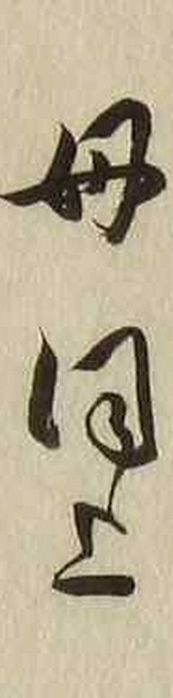母同上

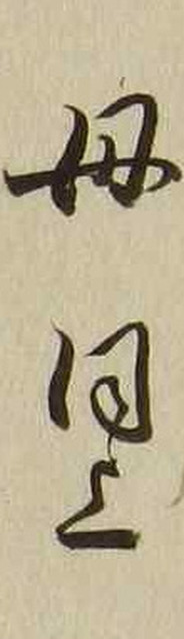母同上
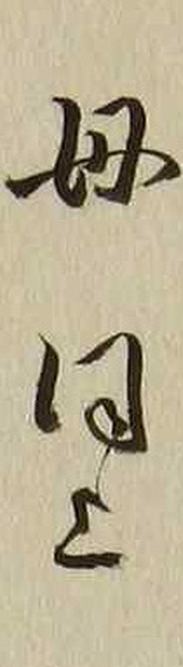母同上
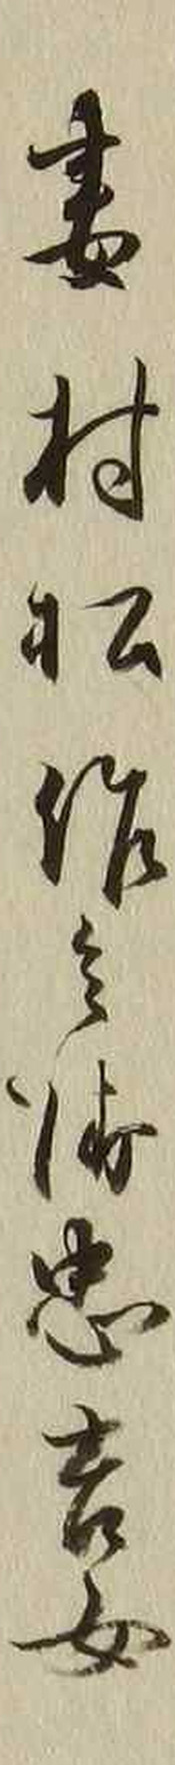妻村松作兵衛忠吉女
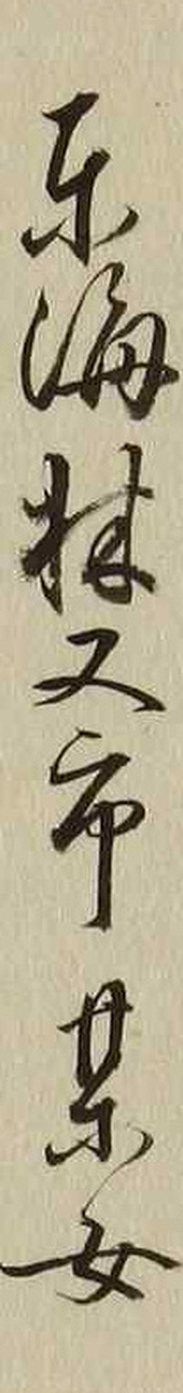東海林又市某女
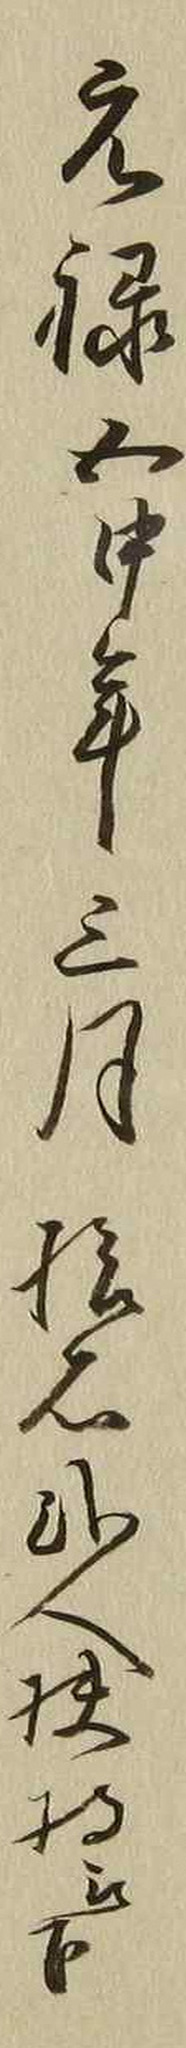元禄五申年三月拾石弐人扶持被下
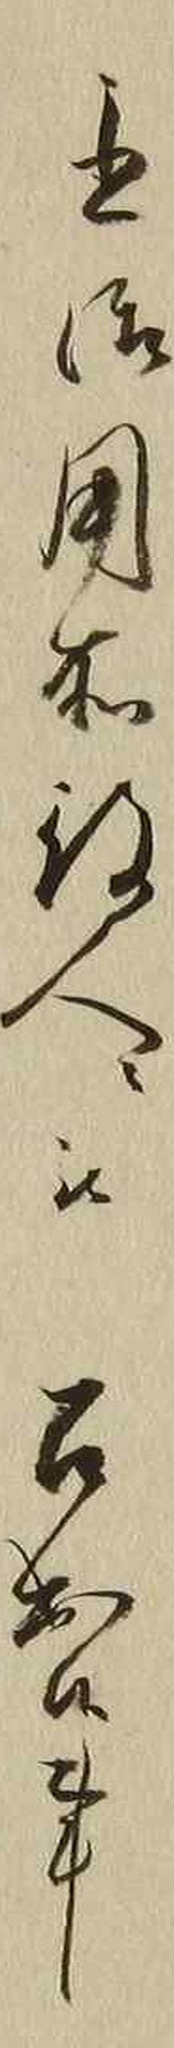置御用所役人ニ被召出候事
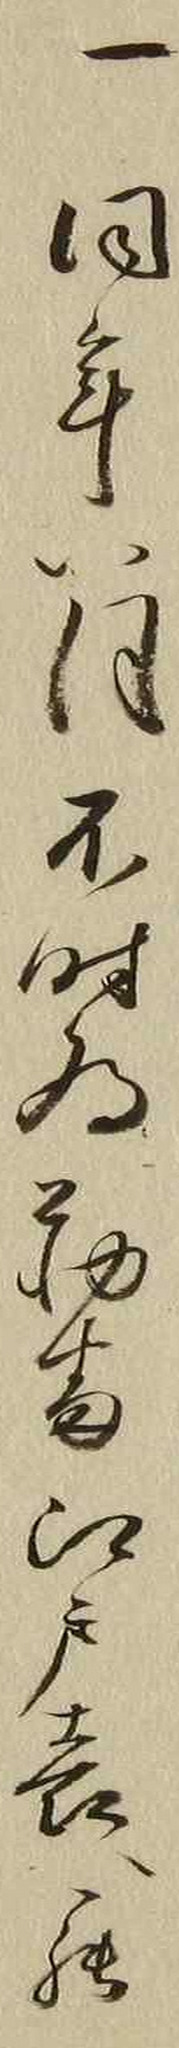一同年八月不時為勤番江戸表へ罷
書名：諸士系譜　巻之28　い之部28
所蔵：会津若松市立会津図書館
